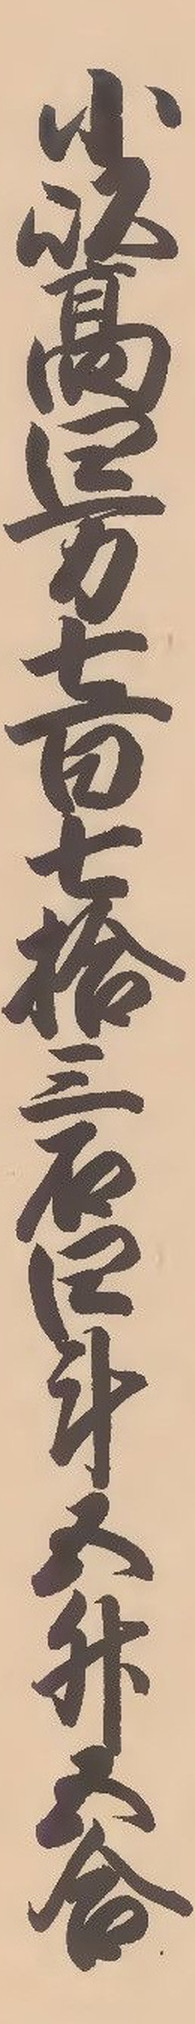小以髙四万七百七拾三石四斗五升五合

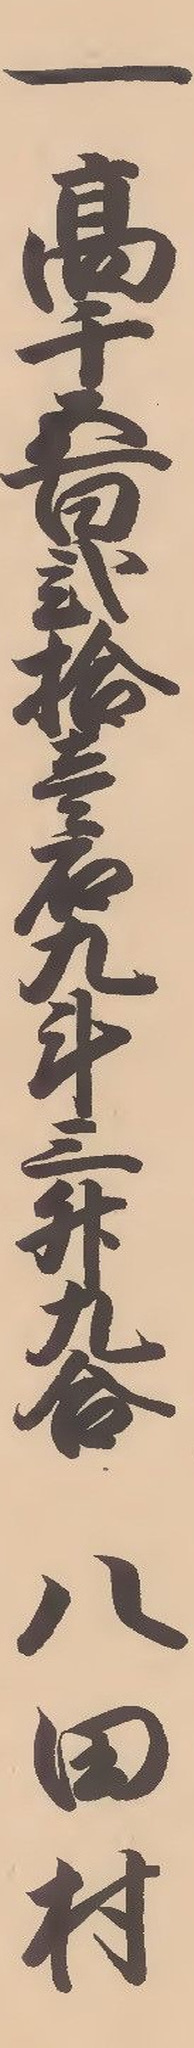一髙千五百弐拾壱石九斗三升九合八田村
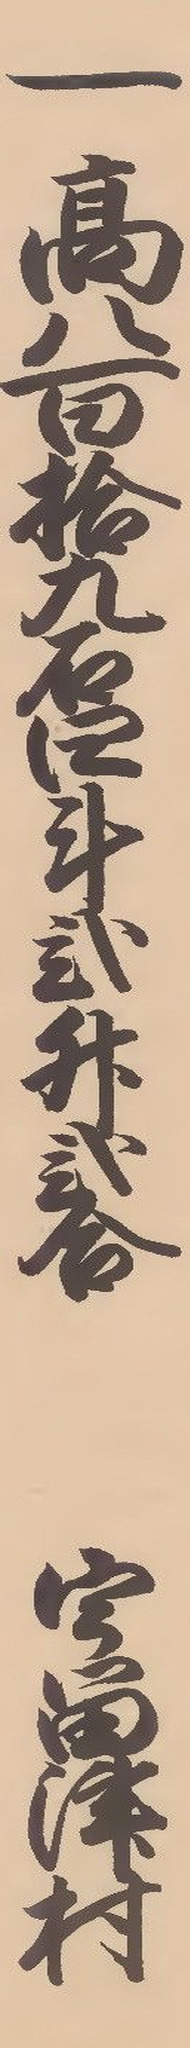一髙八百拾九石四斗弐升弐合宇留津村
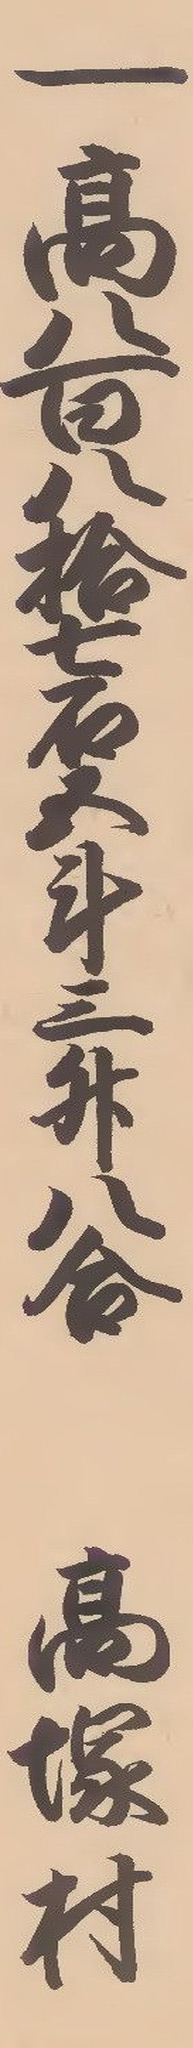一髙八百八拾七石五斗三升八合髙塚村

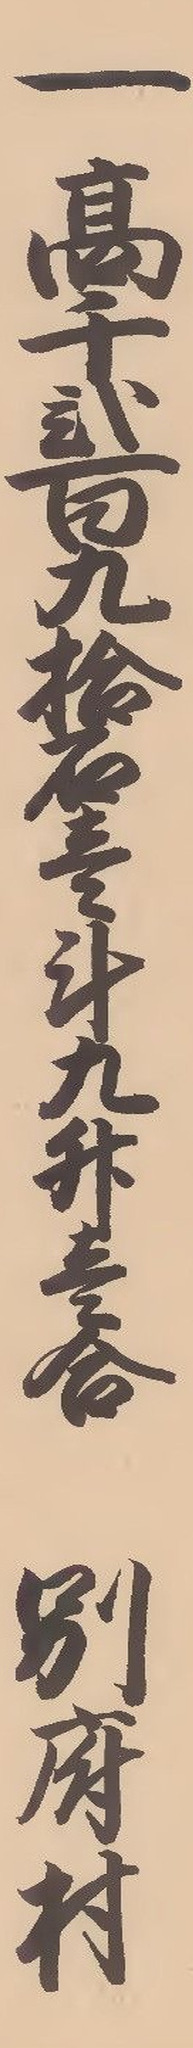一髙千弐百九拾石壱斗九升壱合別府村
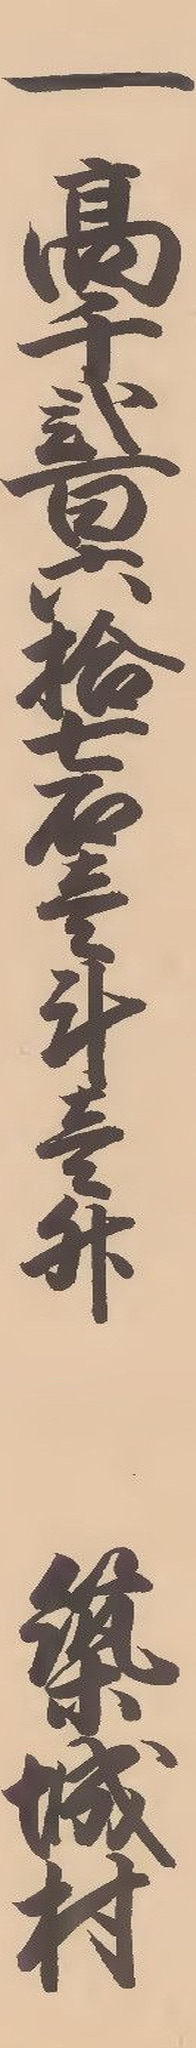一髙千弐百六拾七石壱斗壱升築城村
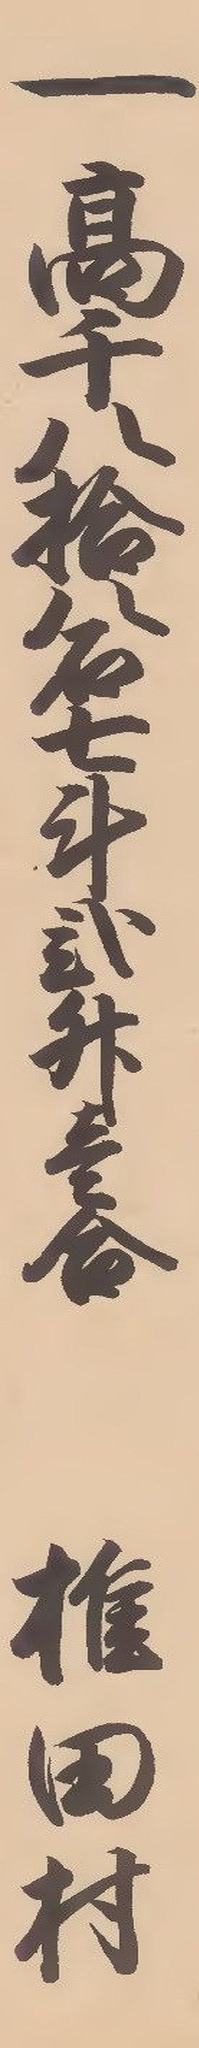一高千八拾八石七斗弐升壱合椎田村
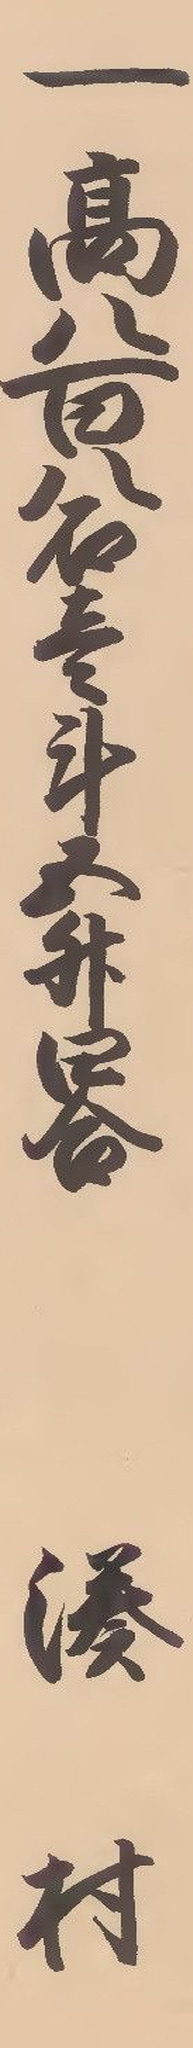一高八百八石壱斗五升四合湊村
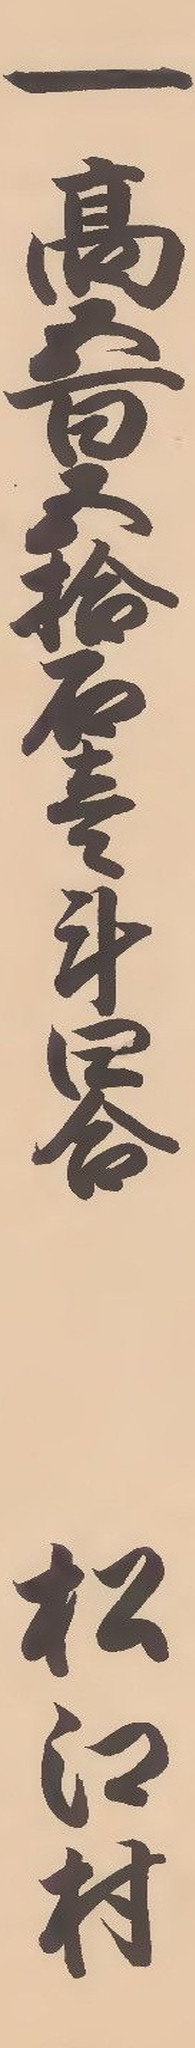一髙五百五拾石壱斗四合松江村
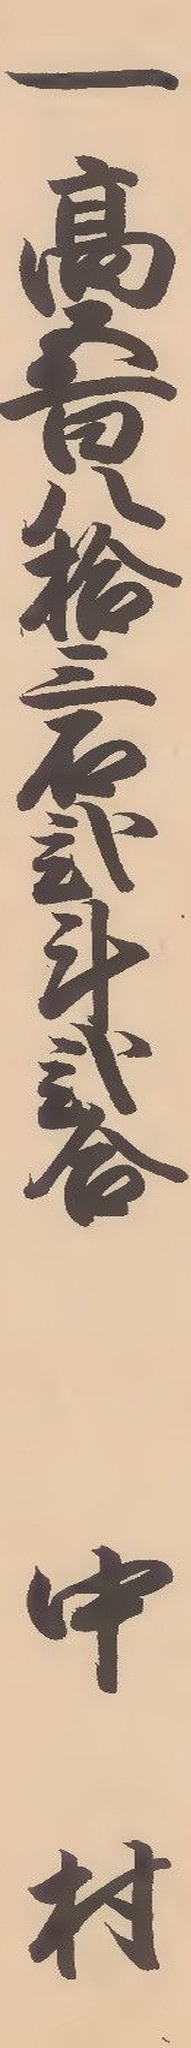一髙五百八拾三石弐斗弐合中村
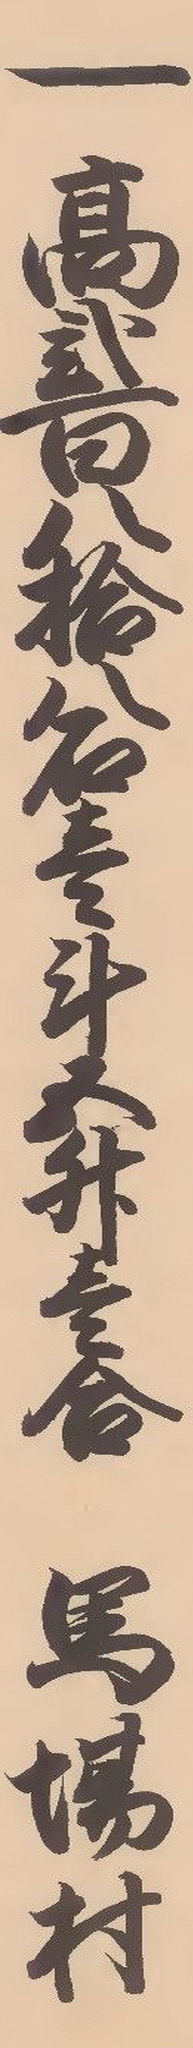一髙弐百八拾八石壱斗五升壱合馬場村
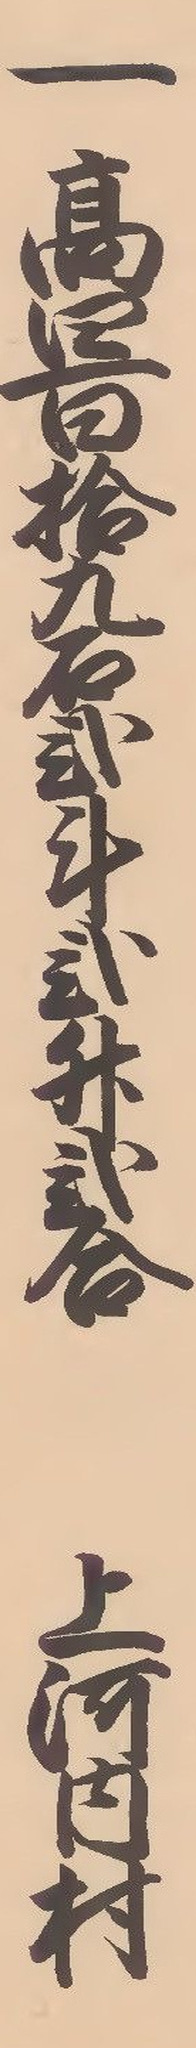一髙四百拾九石弐斗弐升弐合上河内村

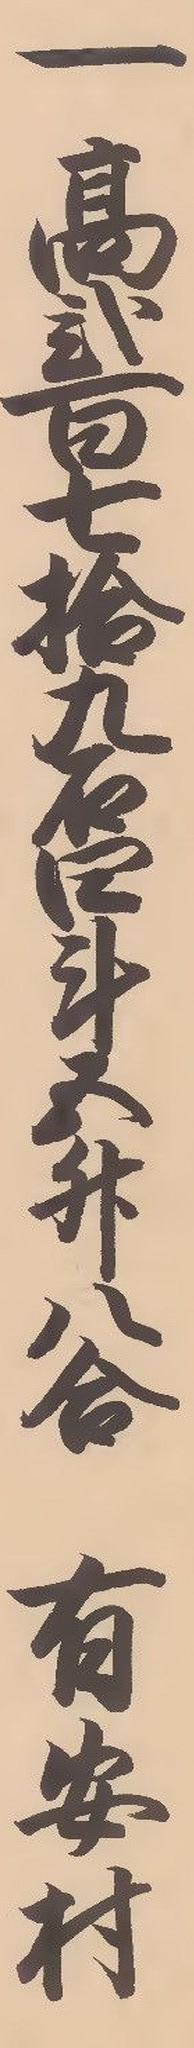一髙弐百七拾九石四斗五升八合有安村
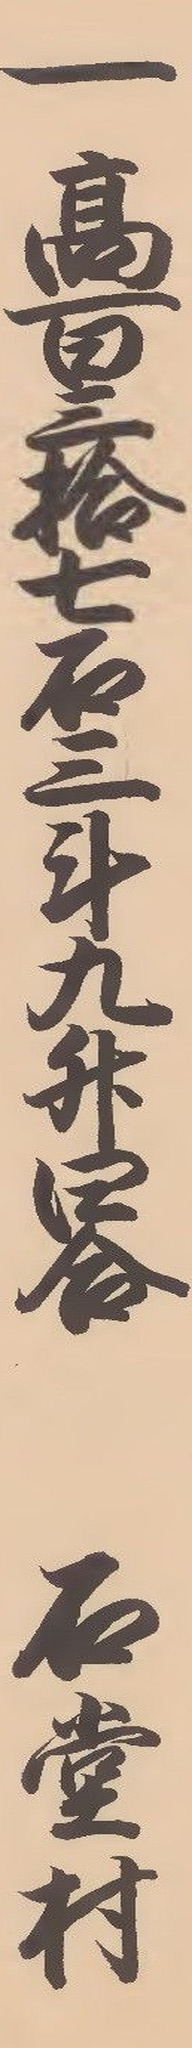一髙百三拾七石三斗九升四合石堂村
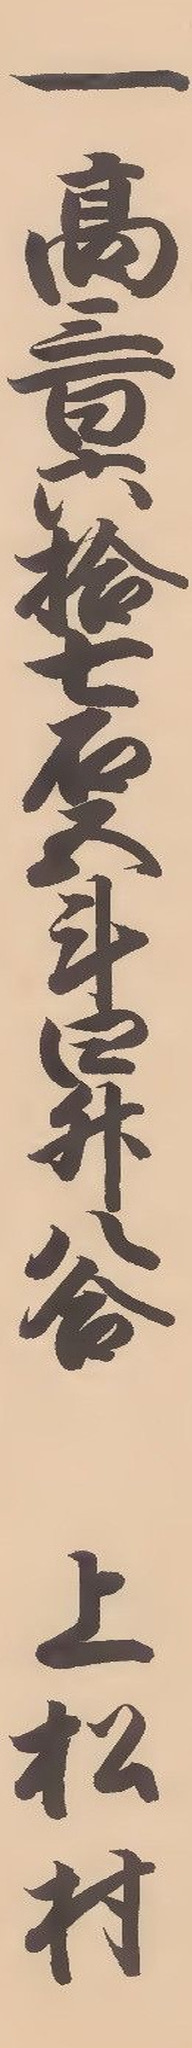一髙三百六拾七石五斗四升八合上松村
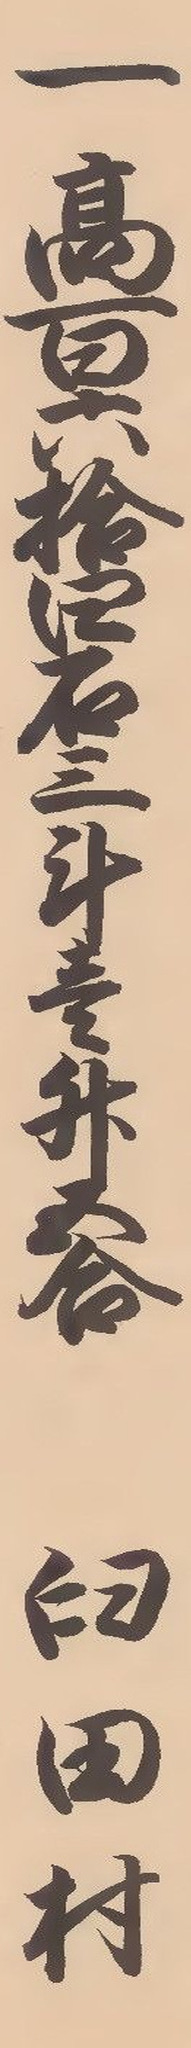一髙百六拾四石三斗壱升五合臼田村
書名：豊前国郷帳
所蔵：国立公文書館 National Archives of Japan
